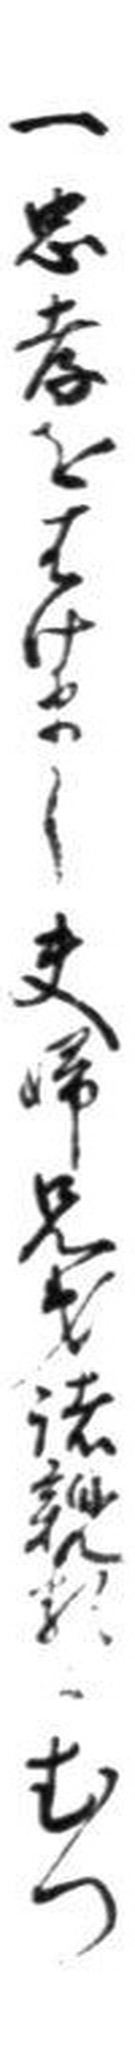一忠孝をはけまし夫婦兄弟諸親類かむつ
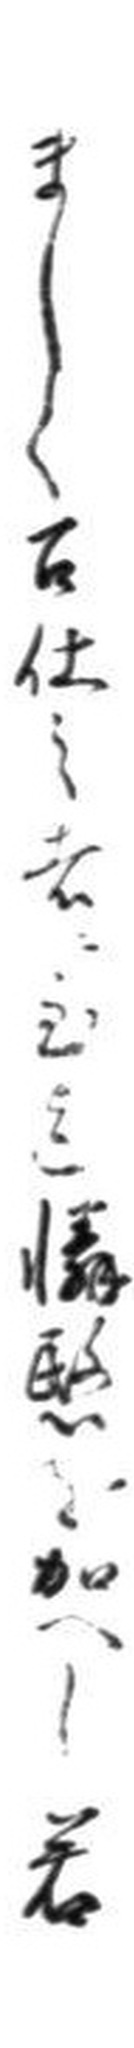ましく召仕之者ニ至迄憐愍を加へし若
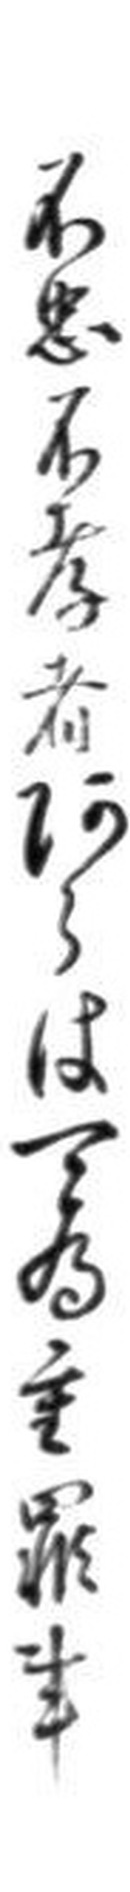不忠不幸者あらは可為重罪事
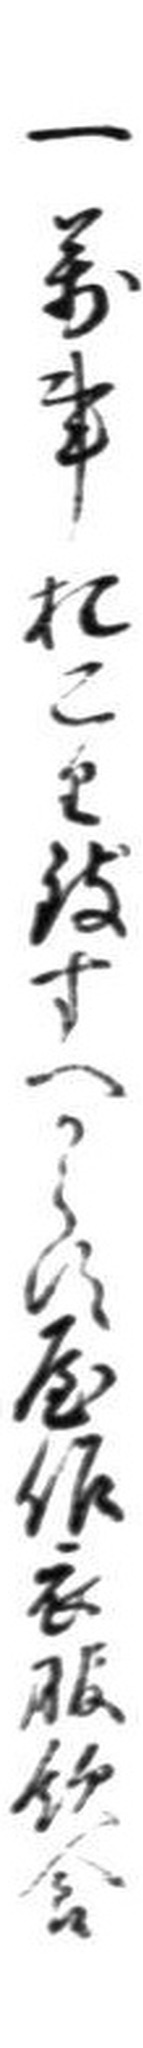一万事おこり致すへからす屋作衣服飲食
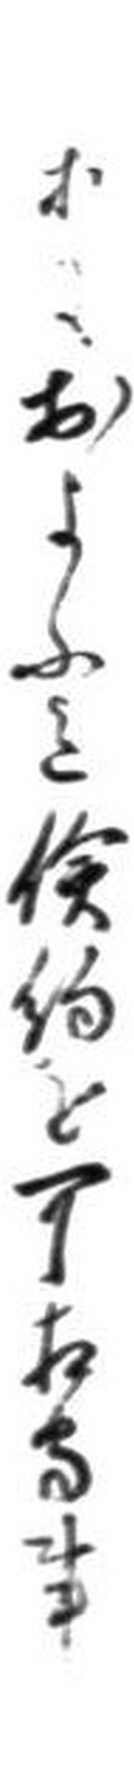等におよふ迄倹約を可相守事
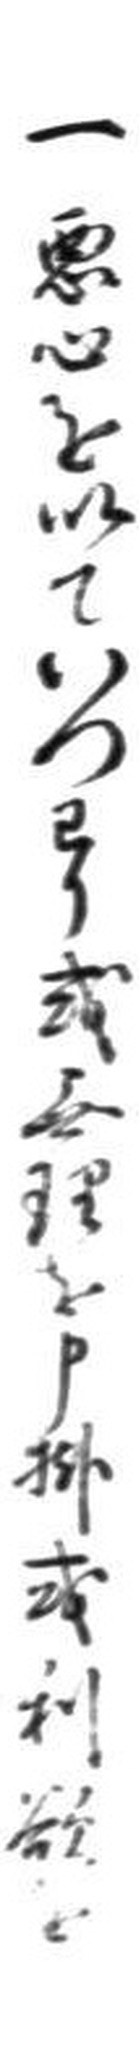一悪心を以ていつわり或無理を申掛或利欲を
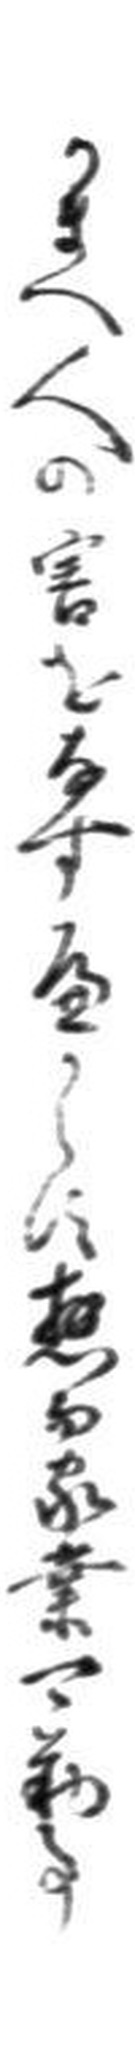かまへ人の害をなすへからす惣而家業可勤事
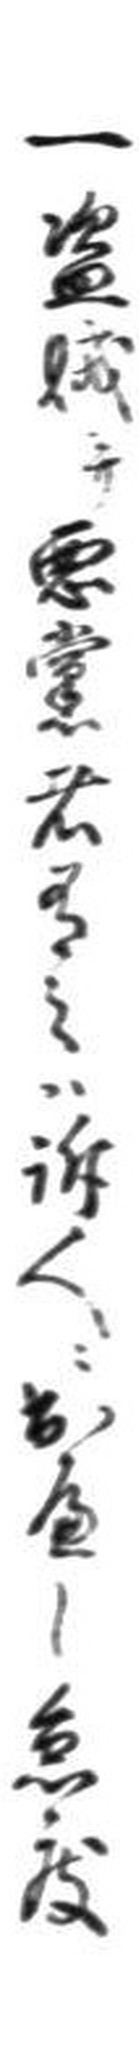一盗賊并悪党者有之ハ訴人ニ出へし急度
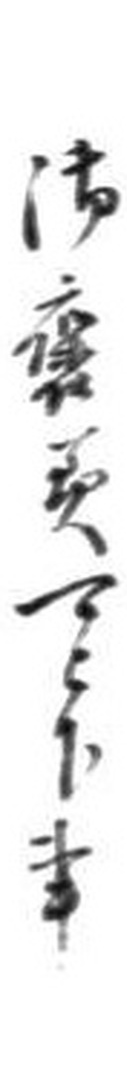御褒美可被下事
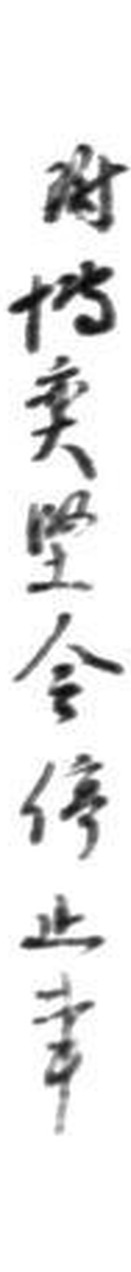附博奕堅令停止事
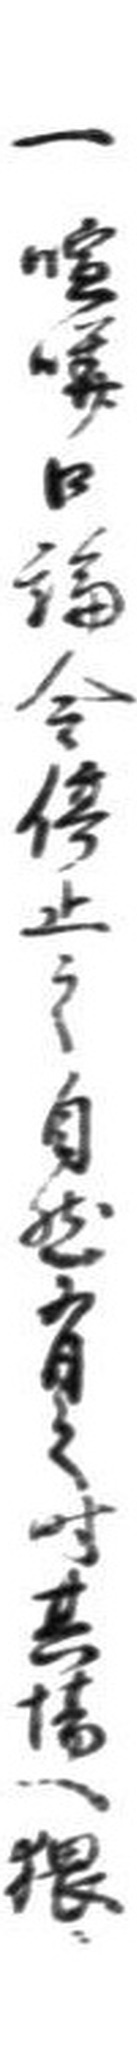一喧嘩口論令停止之自然有之時其場へ猥

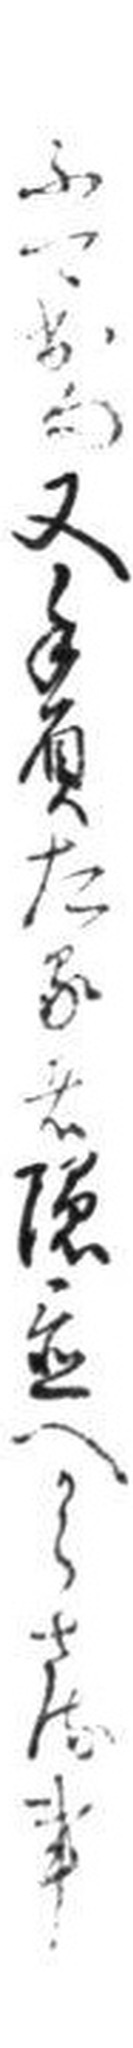不可出向又手負たる者隠置へからさる事
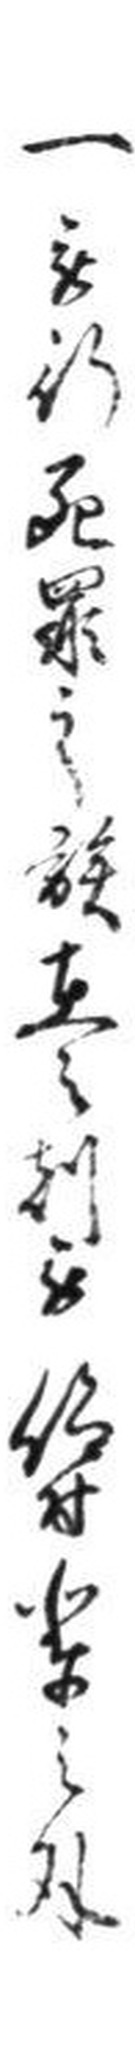一被行死罪之族在々刻被仰付輩之外
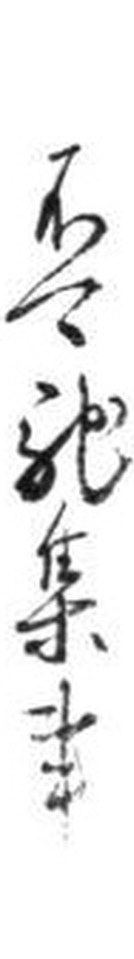不可馳集事
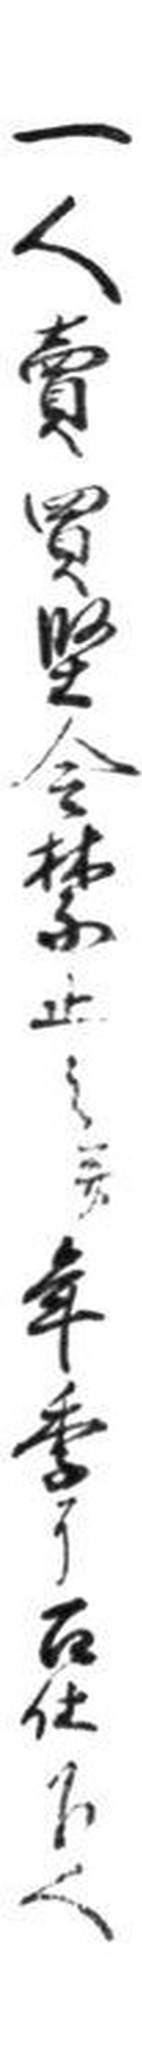一人売買堅令禁止之并年季に召仕下人
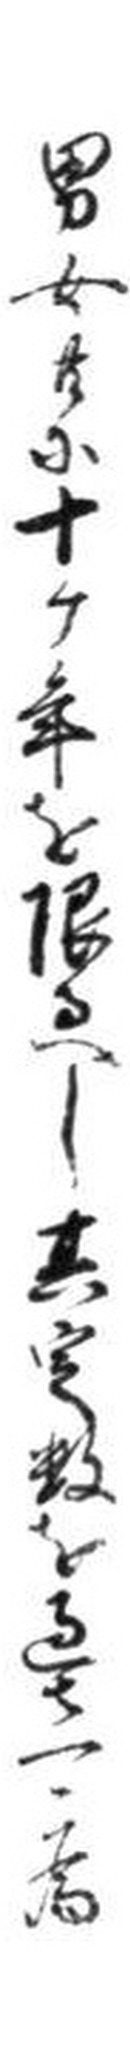男女共に十ヶ年を限るへし其定数を過者可為
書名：家譜 十五 綱昌公 従天和元年到元禄十二年
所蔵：福井県文書館 Fukui Prefectural Archives
